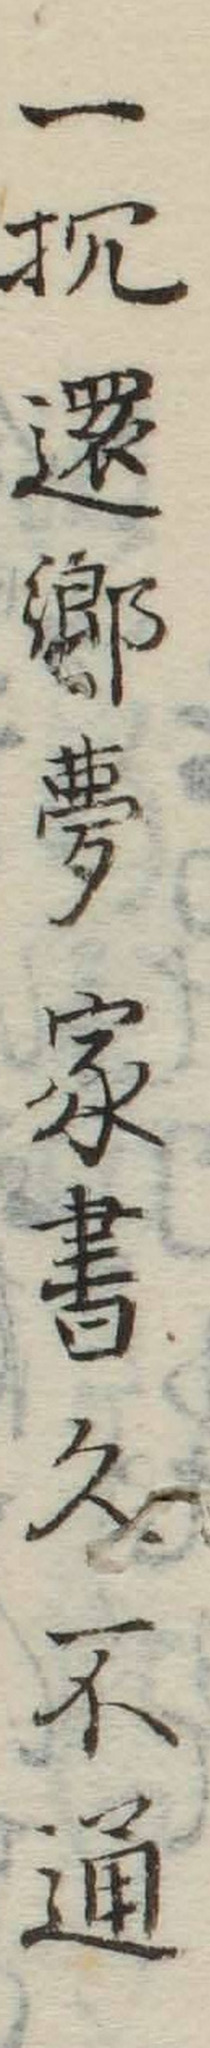一枕還郷夢家書久不通
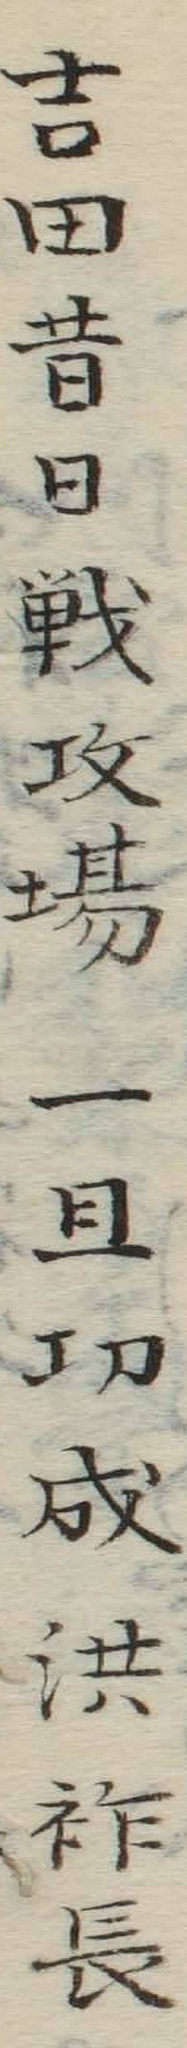吉田昔日戦攻場一旦功成洪祚長

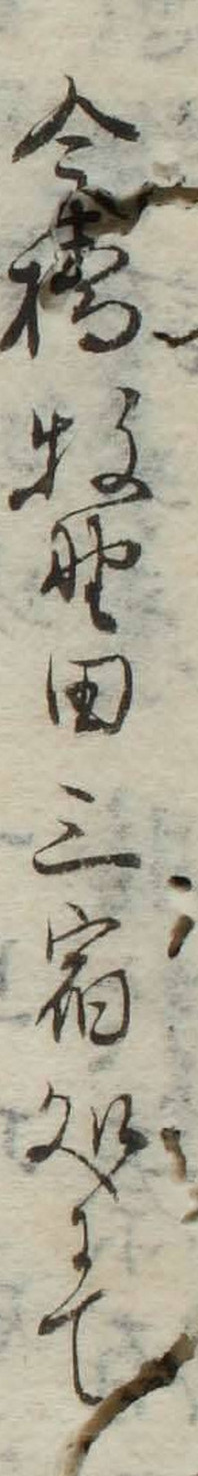今橋牧野田三宿処にて
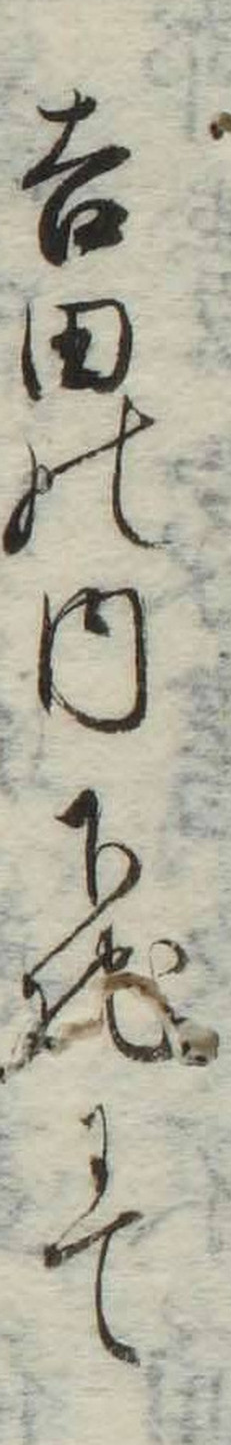吉田の内下地にて
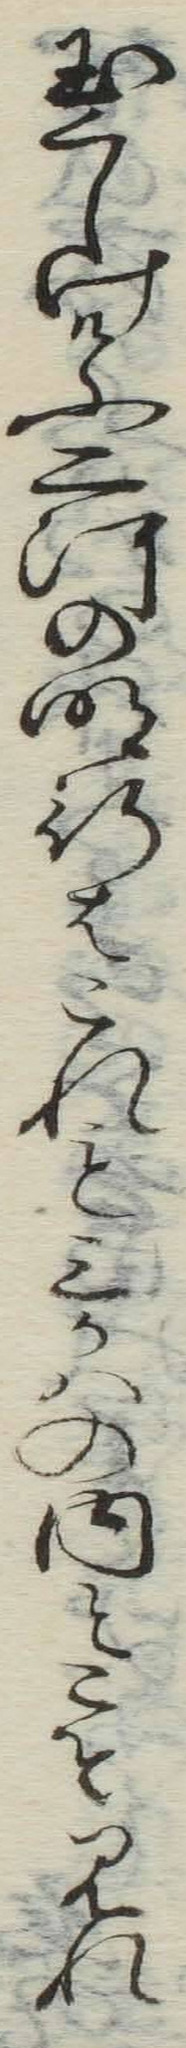玉くしけけふ二河の明行はこれもみかはの内とこそ見れ光廣卿
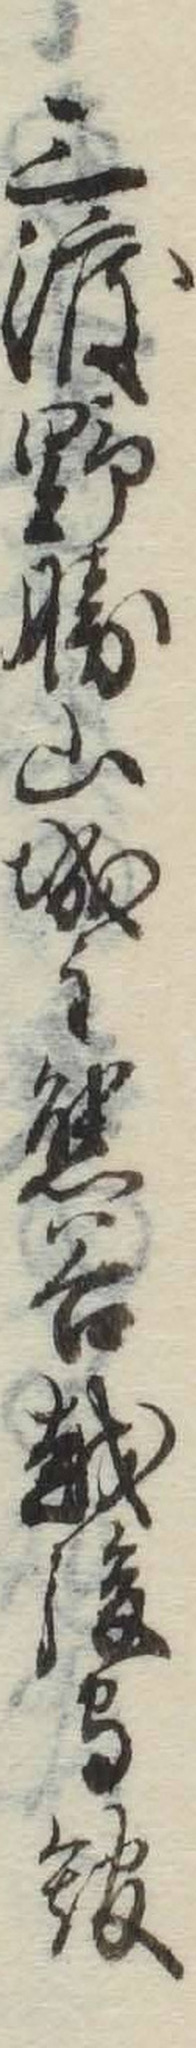三渡野勝山城主熊谷越後守館
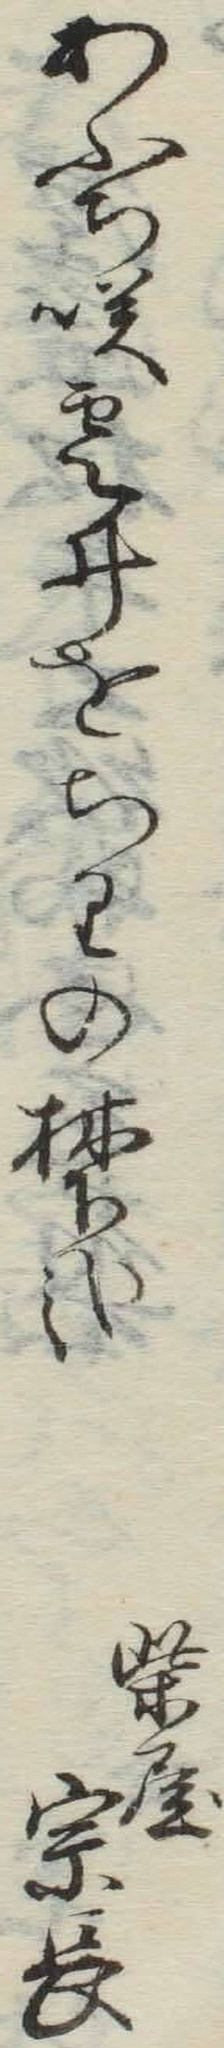あふち咲雲井をちりの麓哉柴屋宗長
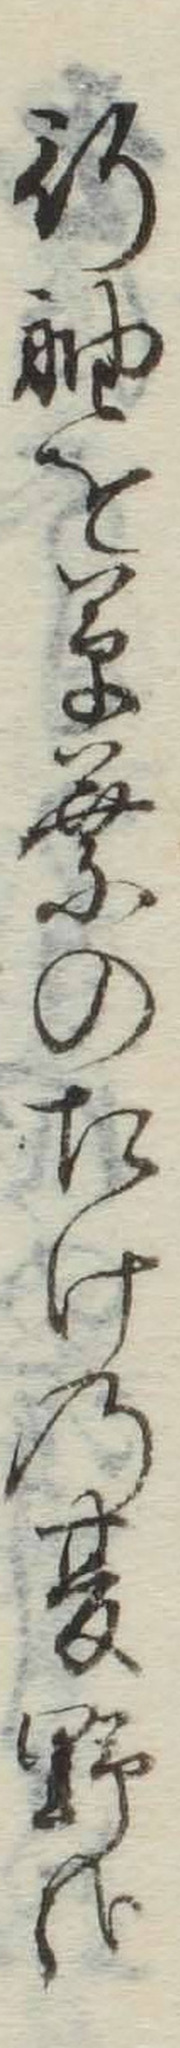行袖を草葉のたけの夏野哉同
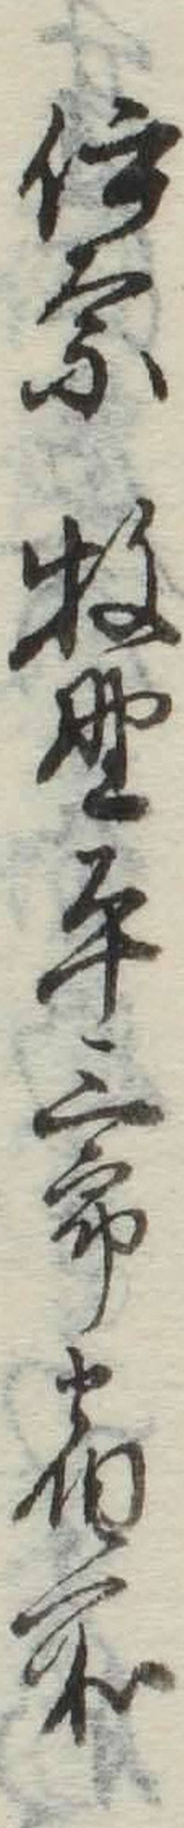伊奈牧野平三郎宿所
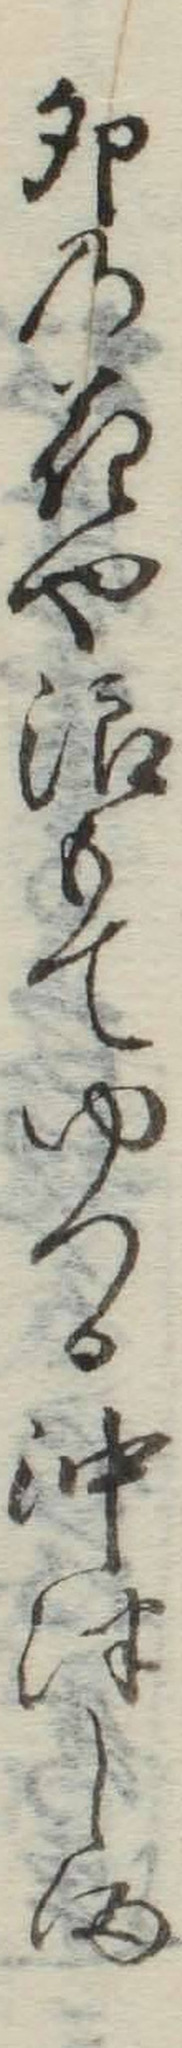卯の花や浪もてゆつる沖つしま宗長
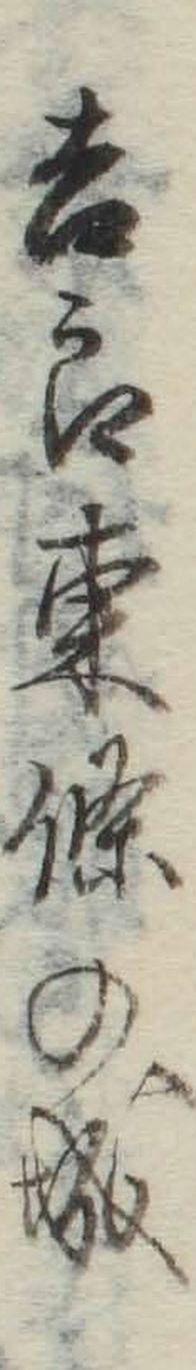吉良東條の城
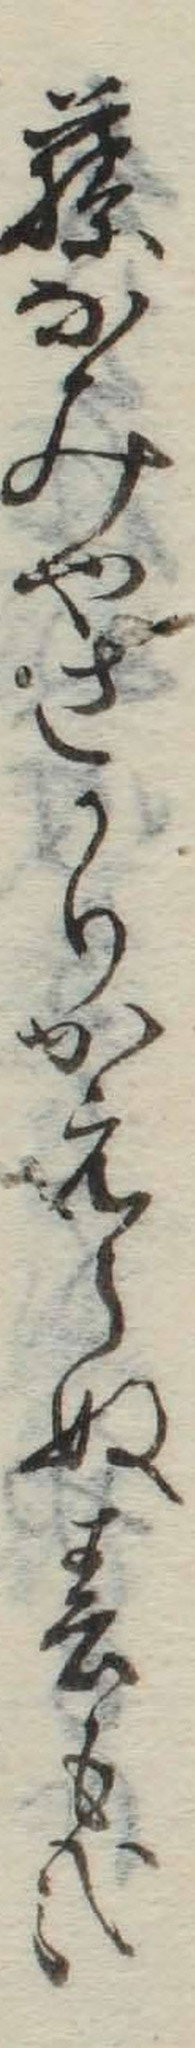藤なみやさかりかえらぬ春も哉忠定
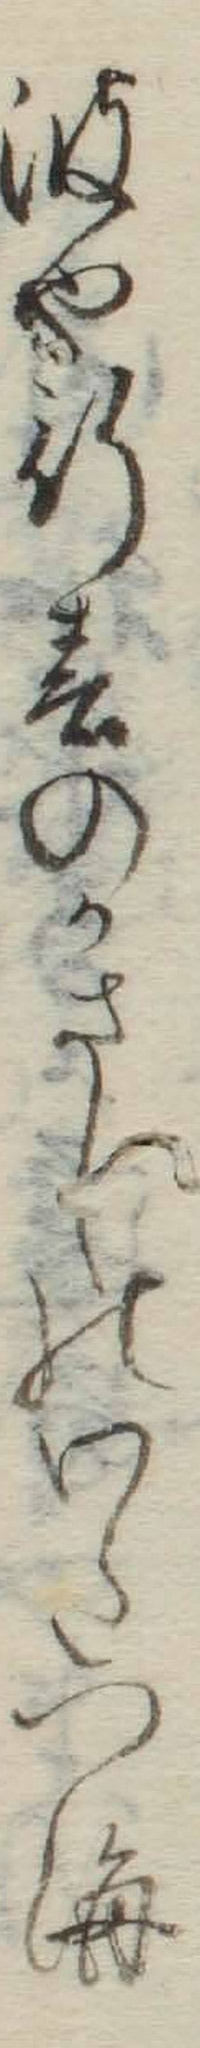波や行春のかさしのわたつ海宗長
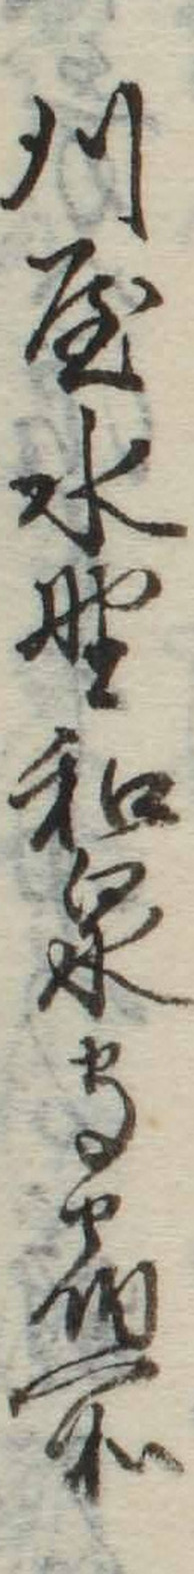刈屋水野和泉守宿所
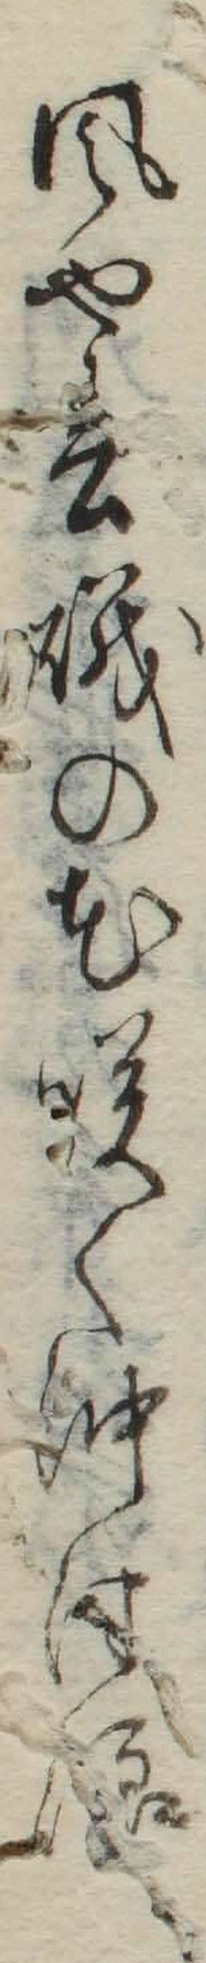風や春磯の花咲沖つ浪同

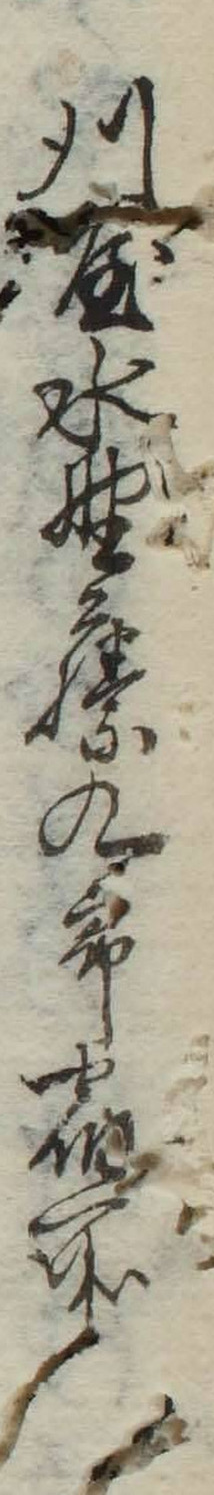刈屋水野藤九郎宿所
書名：三河国二葉松
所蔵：国文学研究資料館
